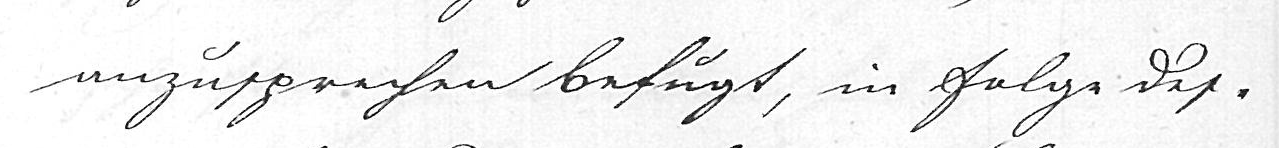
anzusprechen befugt, in Folge des-
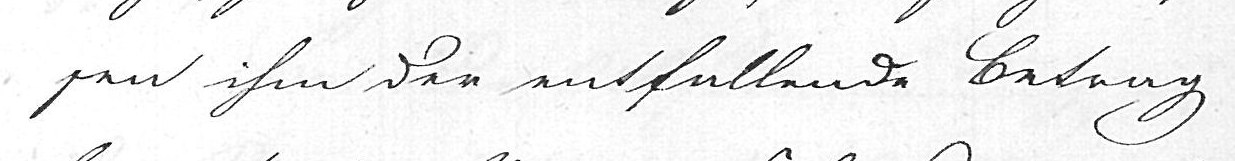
sen ihm der entfallenden Betrag
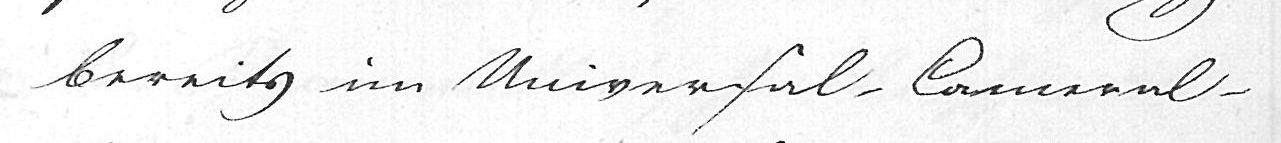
bereits im Universal-Cameral-
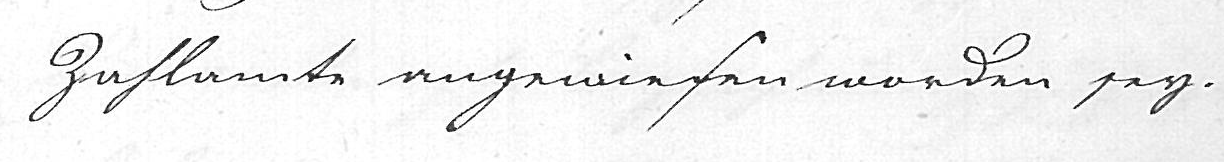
Zahlamte angewiesen worden sey.
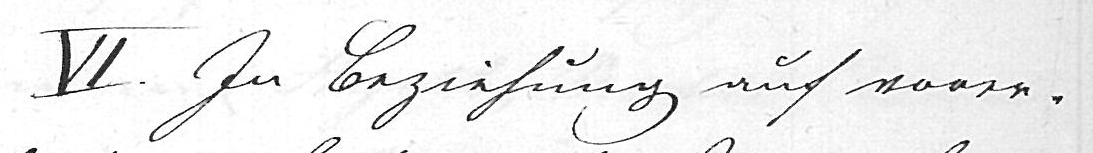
VI. In Beziehung auf vorer-
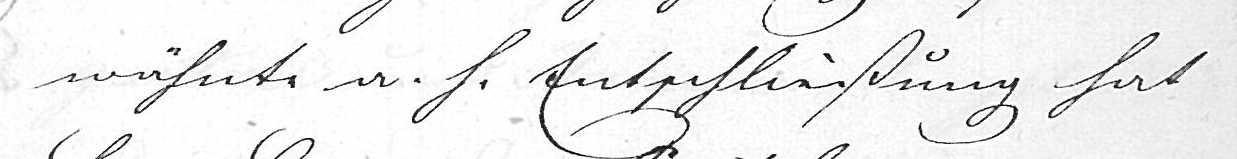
wähnte a. h. Entschließung hat
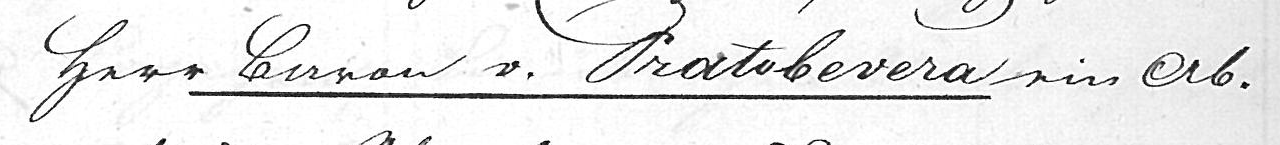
Herr Baron v. Pratobevera ein Ab-
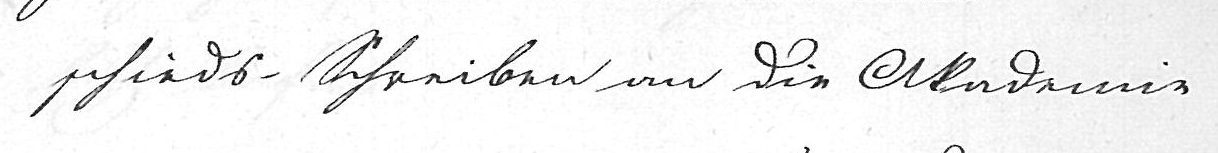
schieds-Schreiben an die Akademie
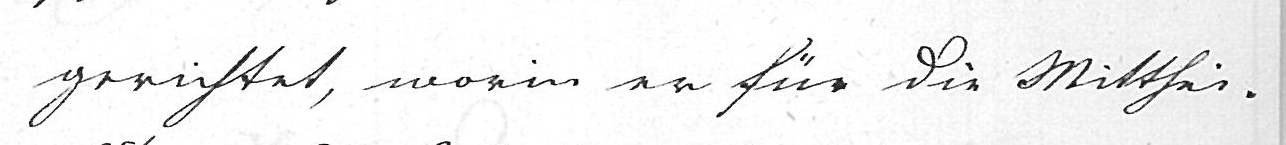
gerichtet, worin er für die Mitthei-
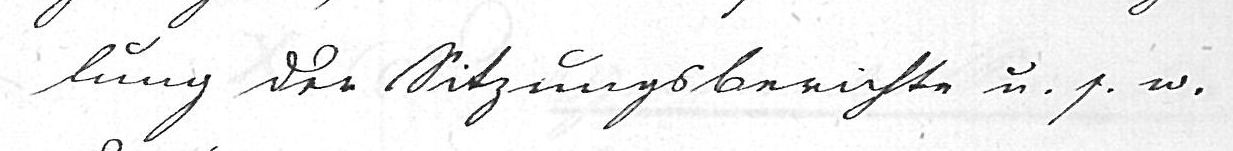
lung der Sitzungsberichte u. s. w.
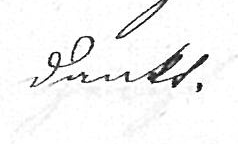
dankt.
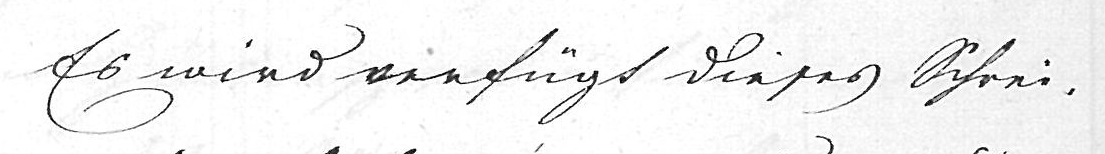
Es wird verfügt dieses Schrei-
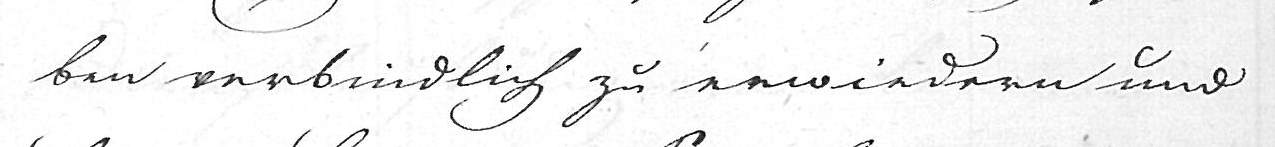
ben verbindlich zu erwiedern und
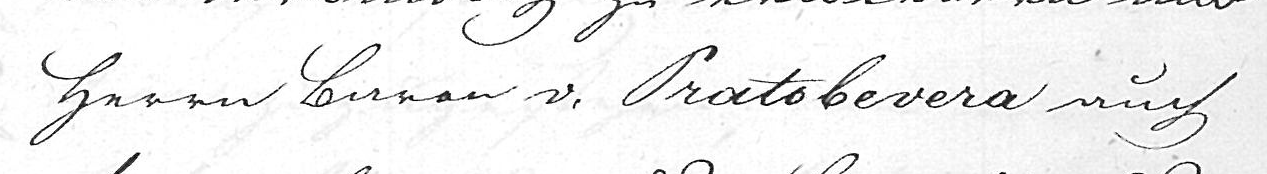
Herrn Baron v. Pratobevera auch
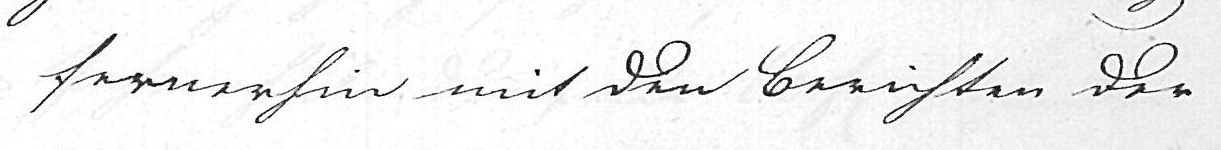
fernerhin mit den Berichten der
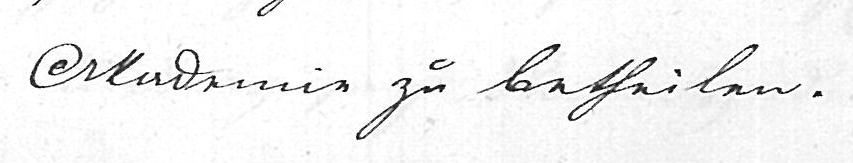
Akademie zu betheilen.
